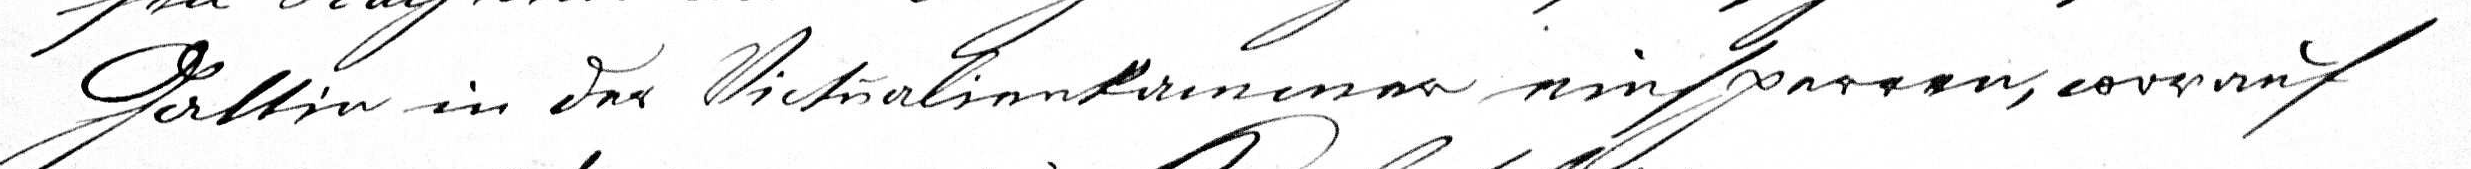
Gatting in der Victualienkammer einsperren, worauf
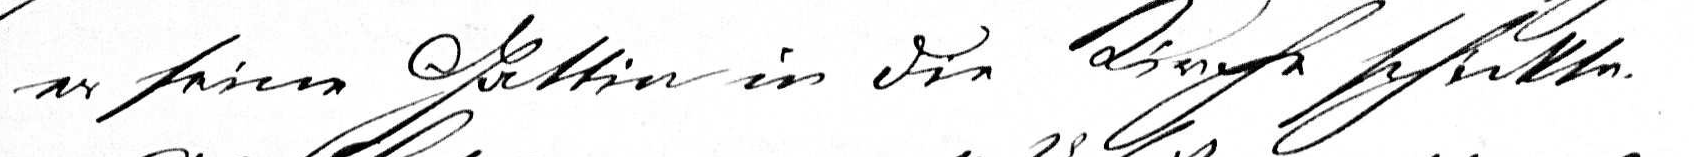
er seine Gattin in die Kirche schickte.
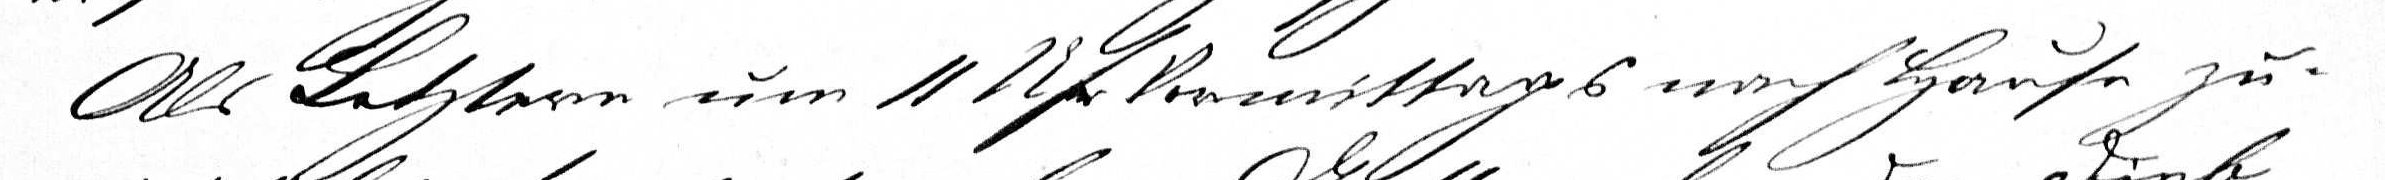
Als Letztere um 11 Uhr Vormittags nach Hause zu¬
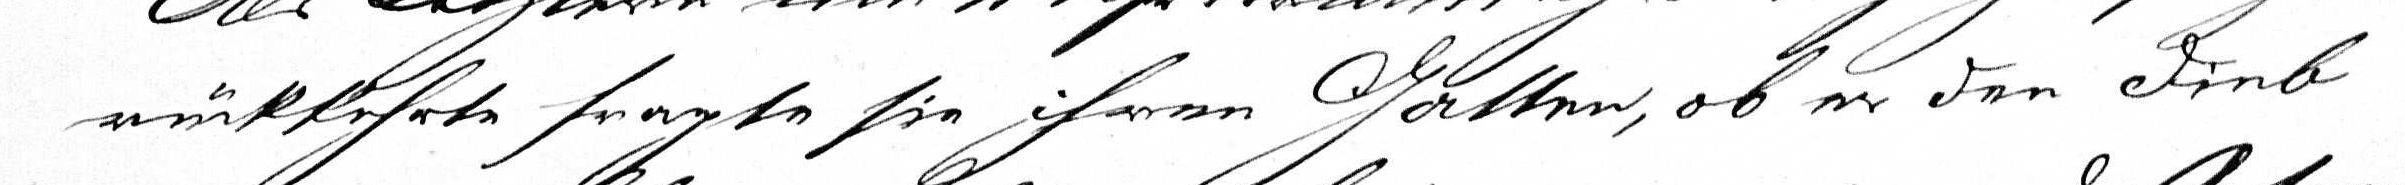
rückkehrte fragte sie ihren Gatten, ob er den Dieb
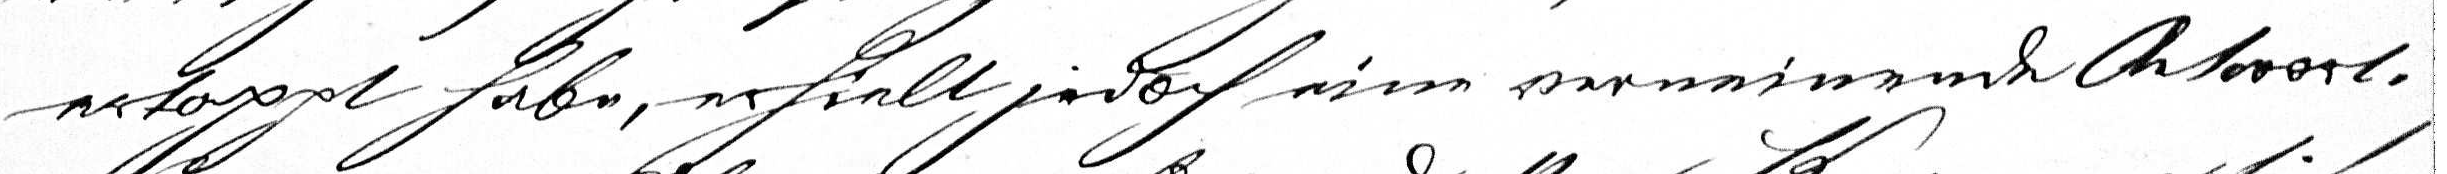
ertappt habe, erhielt jedoch eine verneinende Antwort.
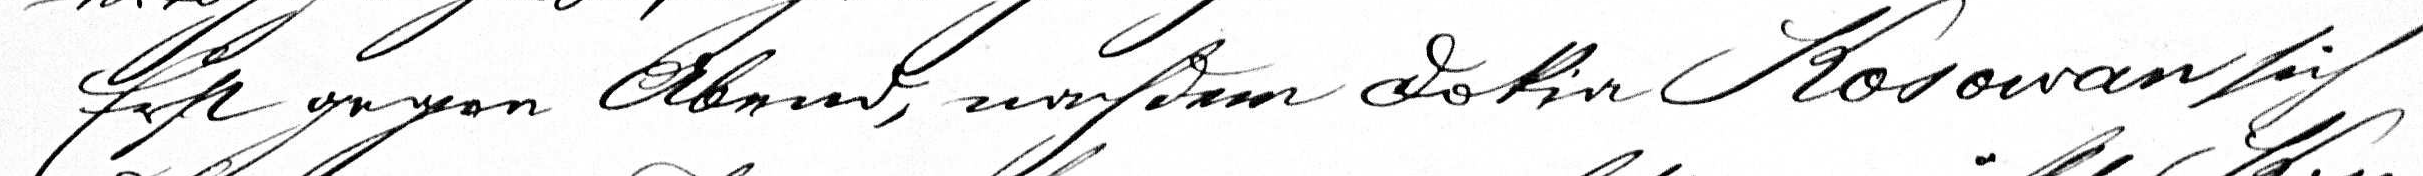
Erst gegen Abend, nach dem Dokia Kosowan sich
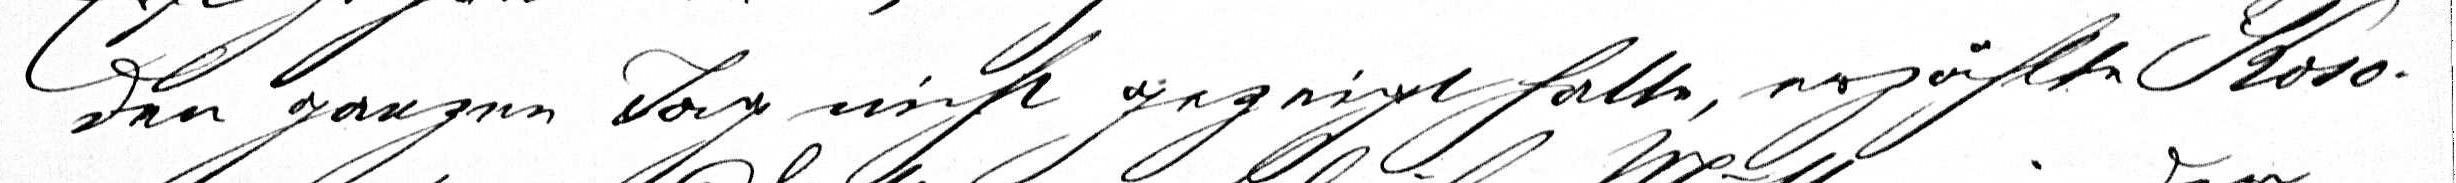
den ganzen Tag nicht gezeigt hatte, erzählte Koso¬
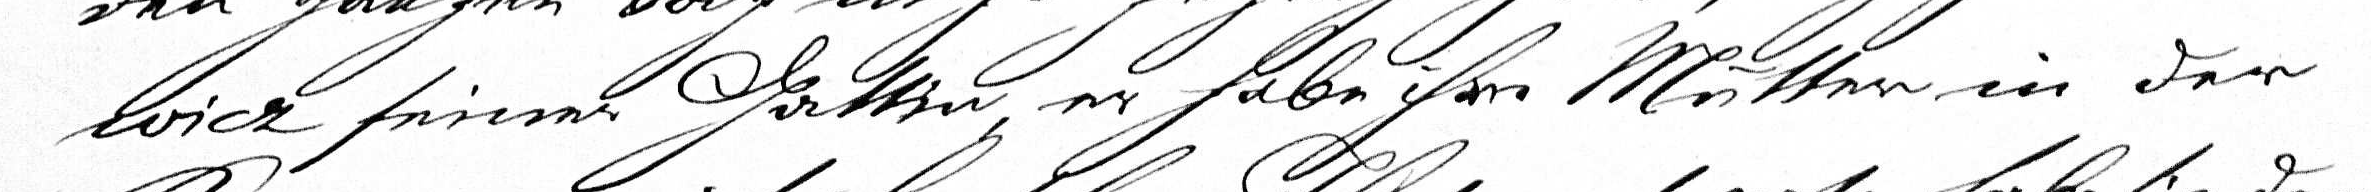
wicz seiner Gattin, er habe ihre Mutter in der
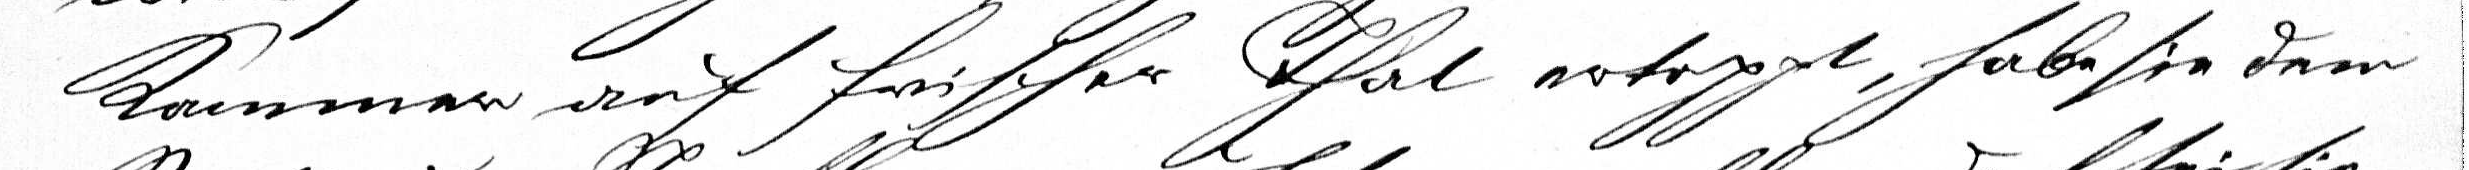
Kammer auf frischer That ertappt, habe sie dem
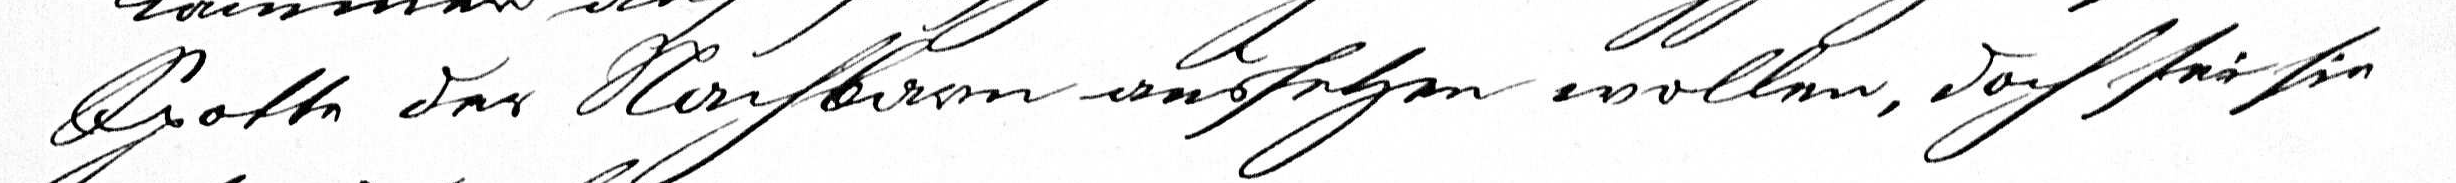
Spotte der Nachbarn aussetzen wollen, doch sei sie
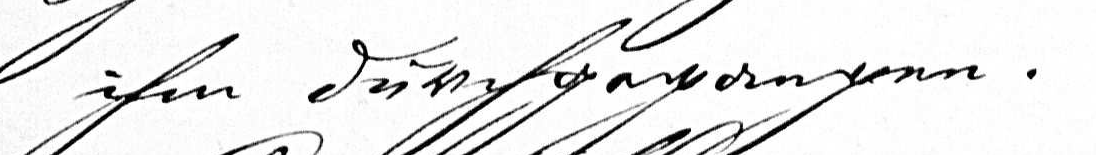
ihm durchgegangen.
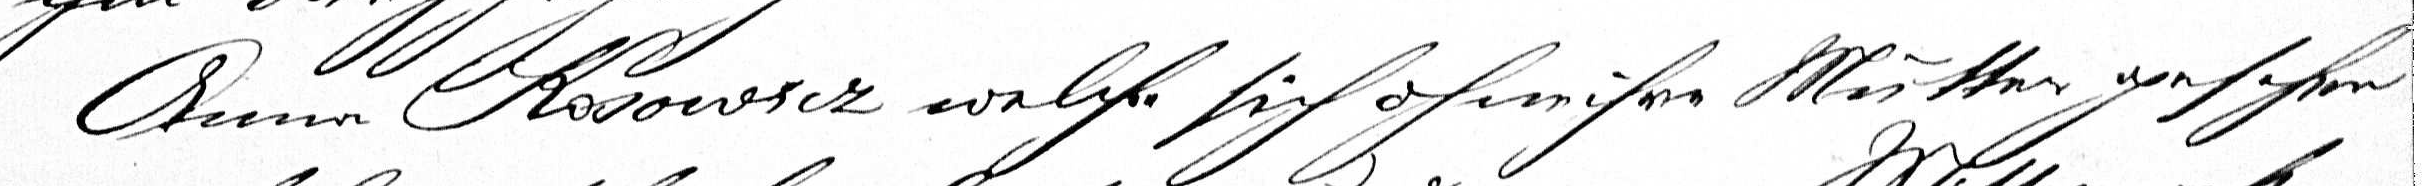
Anna Kosowicz welche sich ohne ihre Mutter gesehen
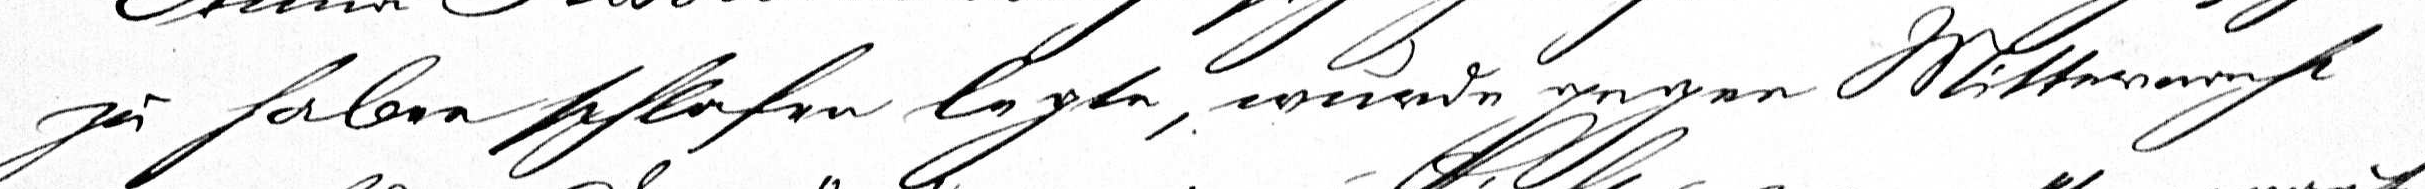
zu haben schlafen legte, wurde gegen Mitternacht
